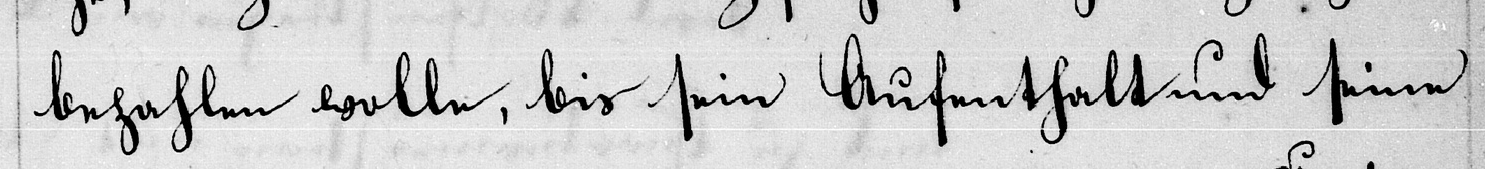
bezahlen wolle, bis sein Aufenthalt und seine
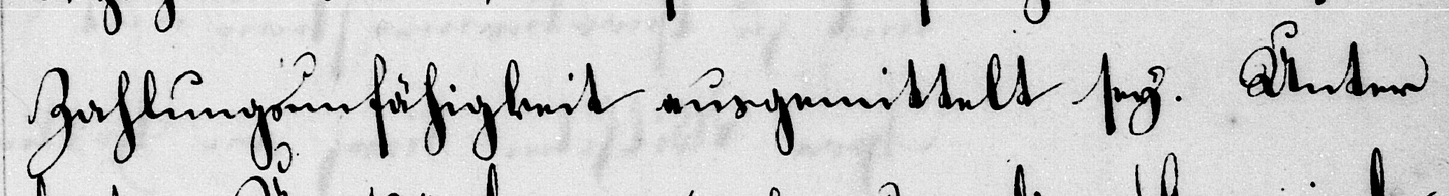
Zahlungsunfähigkeit ausgemittelt sey. Unter
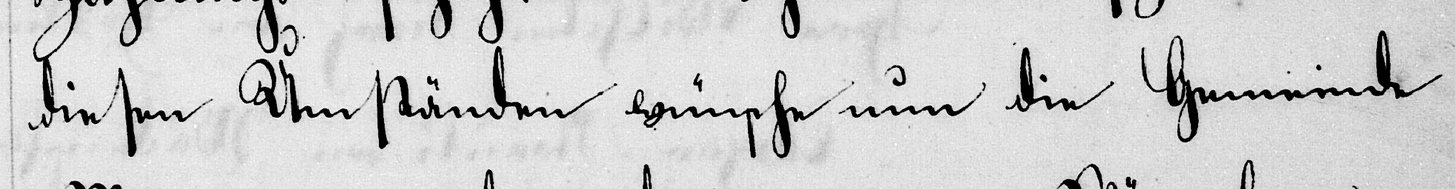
diesen Umständen wünsche nun die Gemeinde
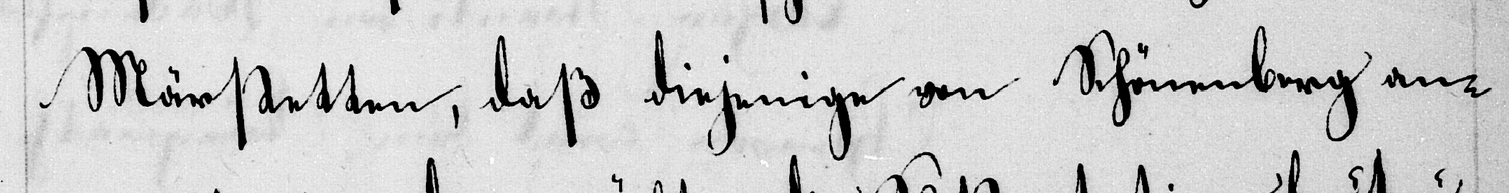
Märstetten, daß diejenige von Schönenberg an¬
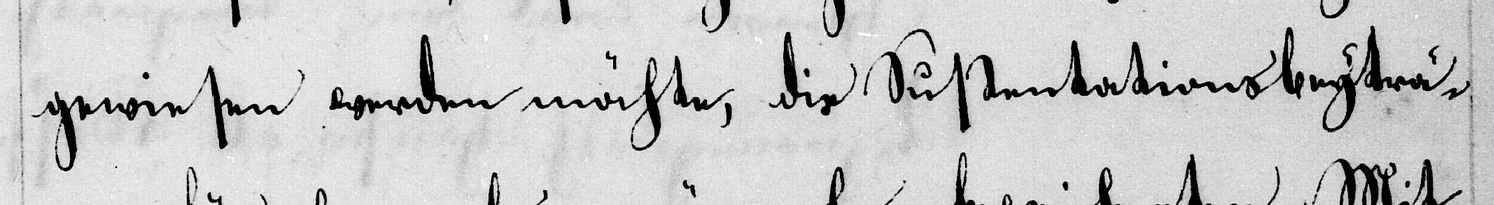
gewiesen werden möchte, die Sustentationsbeyträ¬
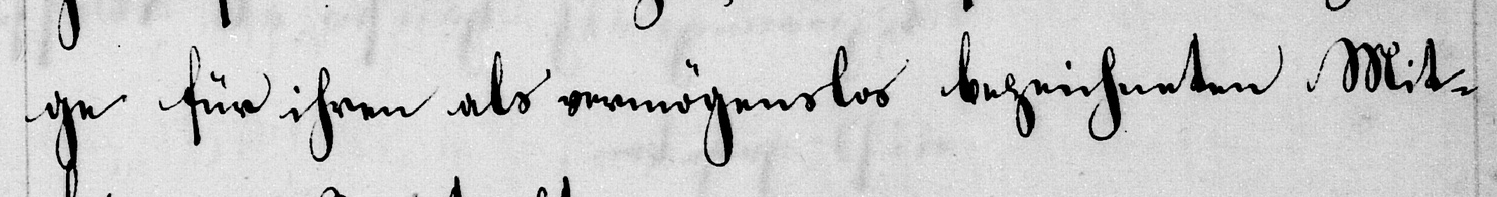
ge für ihren als vermögenslos bezeichneten Mit¬
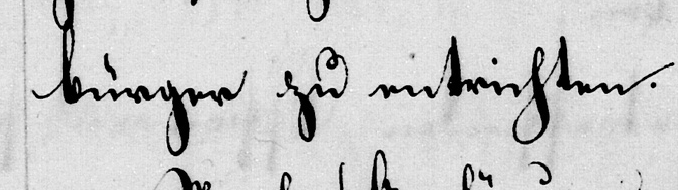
bürger zu entrichten.
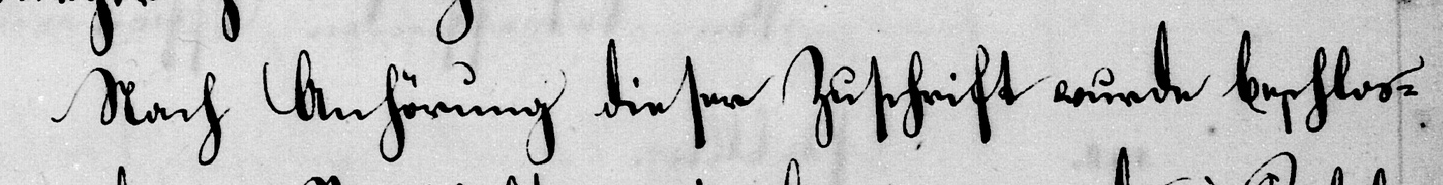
Nach Anhörung dieser Zuschrift wurde beschloß¬
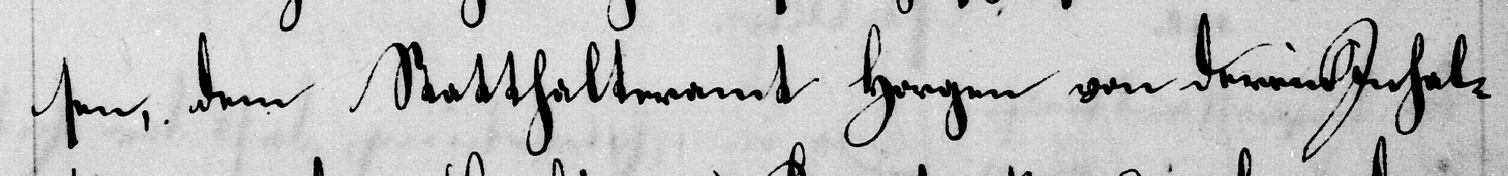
en, dem Statthalteramt Horgen von diesem Inhal¬
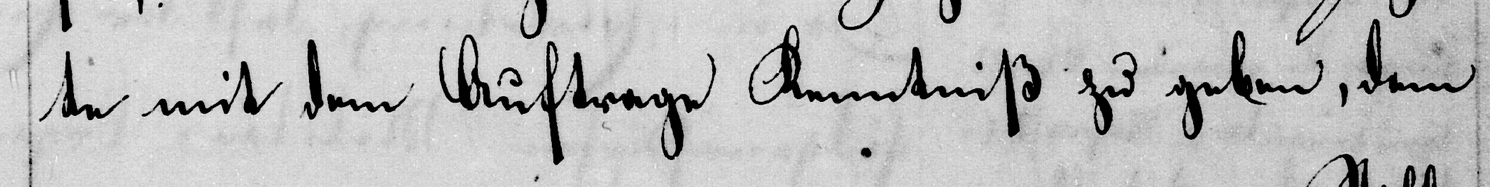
te mit dem Auftrage Kenntniß zu geben, dem
